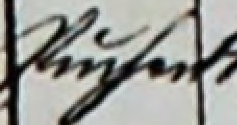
Puchen
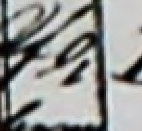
Pfl„
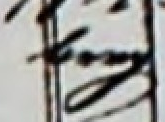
berg
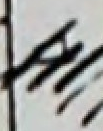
41
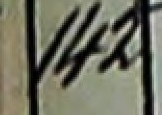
142
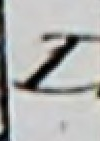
I
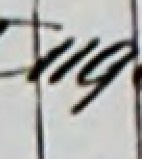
119
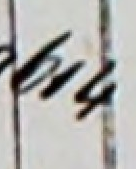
614
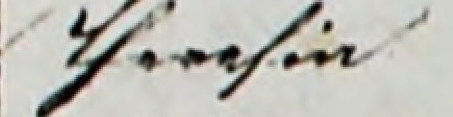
Theresia
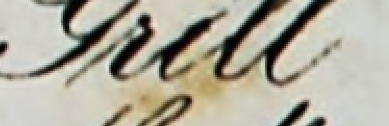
Grill
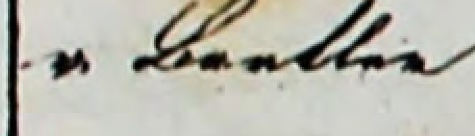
v Bartler
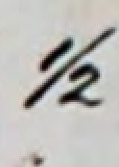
1/2
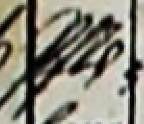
Pfld„
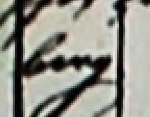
berg
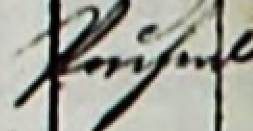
Puchen
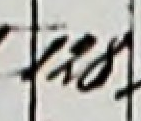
128
